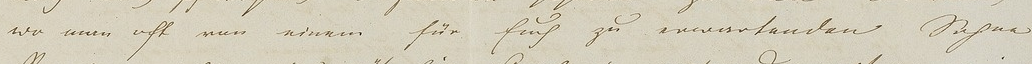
wo man oft von einem für Euch zu erwartenden Sohne
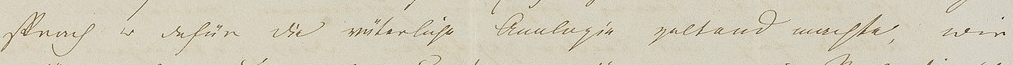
sprach & dafür die väterliche Analogie geltend machte, wir
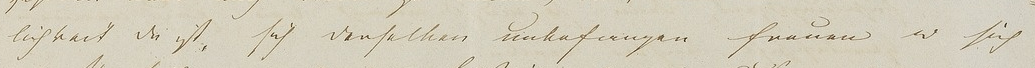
lichkeit da ist, sich derselben unbefangen freuen & sich
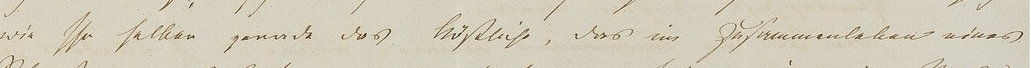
wie Ihr selber gerade das Köstliche, das im Zusammenleben eines
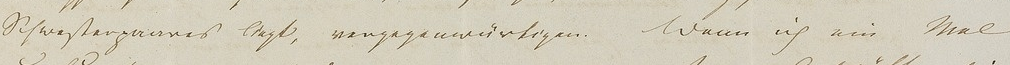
Schwesterpaares liegt, vergegenwärtigen. Wenn ich ein Mal
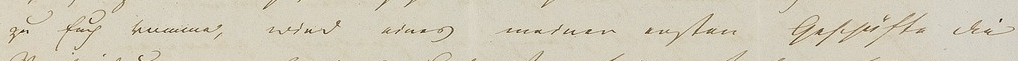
zu Euch komme, wird eines meiner ersten Geschäfte die
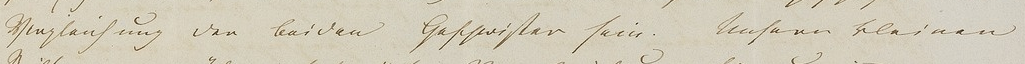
Vergleichung der beiden Geschwister sein. Unsern kleinen
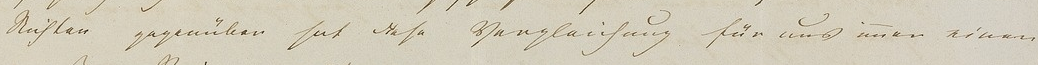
Nichten gegenüber hat diese Vergleichung für uns immer einen
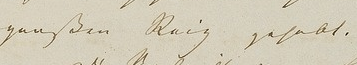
großen Reiz gehabt.
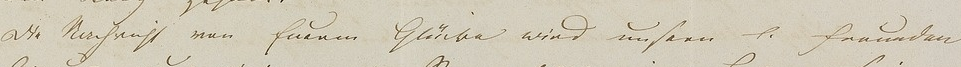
Die Nachricht von Euerm Glücke wird unsern l. Freunden
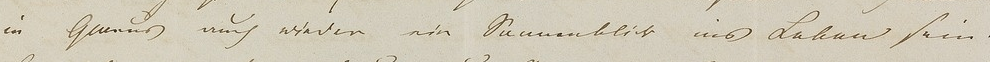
in Glarus auch wieder ein Sonnenblick ins Leben sein.
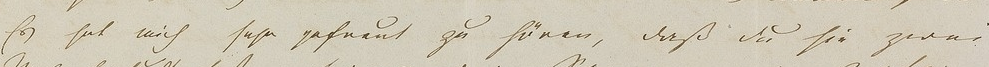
Es hat mich sehr gefreut zu hören, daß du sie zwei
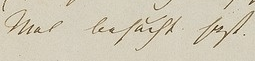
Mal besucht hast.
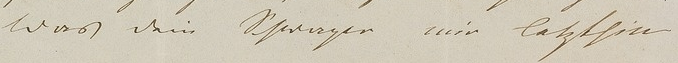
Was dein Schwager mir letzthin
